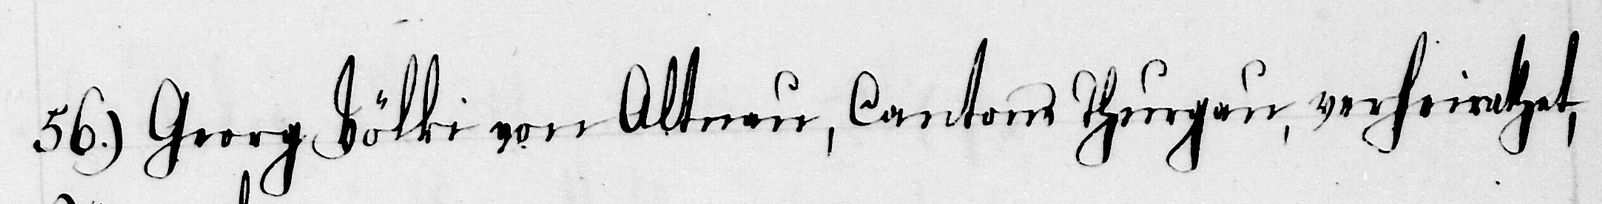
56.) Georg Völki von Altnau, Cantons Thurgau, verheirathet,
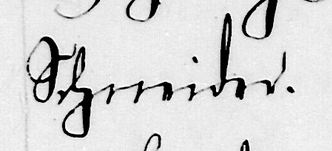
Schneider.
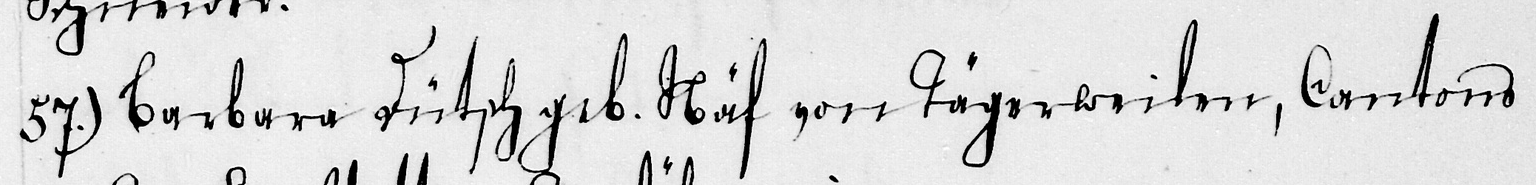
57.) Barbara Dütsch geb. Näf von Tägerweilen, Cantons
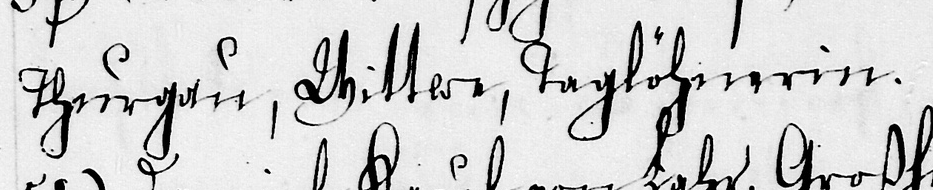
Thurgau, Wittwe, Taglöhnerin.
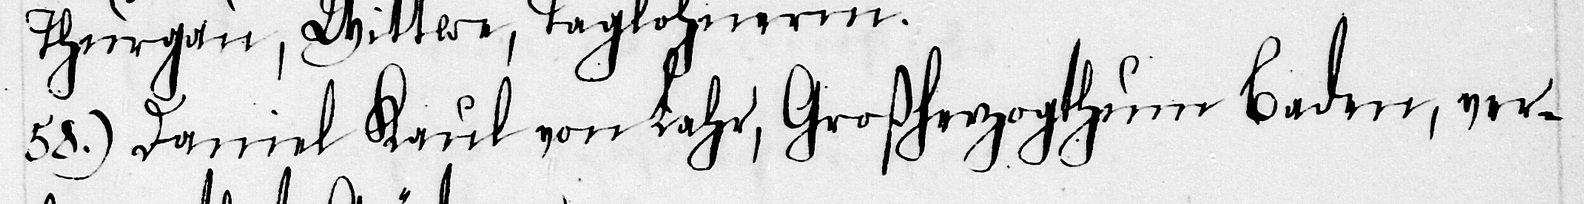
58.) Daniel Kaul von Lahr, Großherzogthum Baden, ver¬
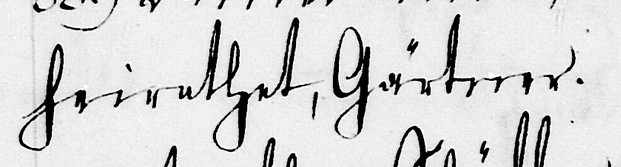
heirathet, Gärtner.
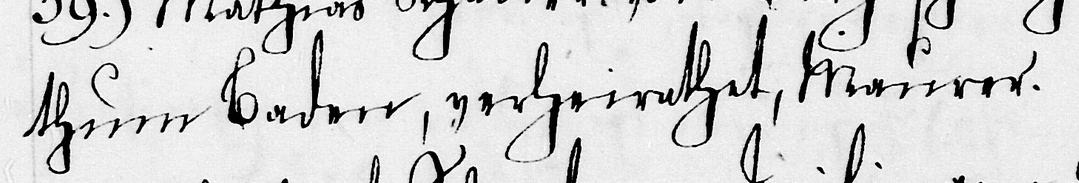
thum Baden, verheirathet, Maurer.
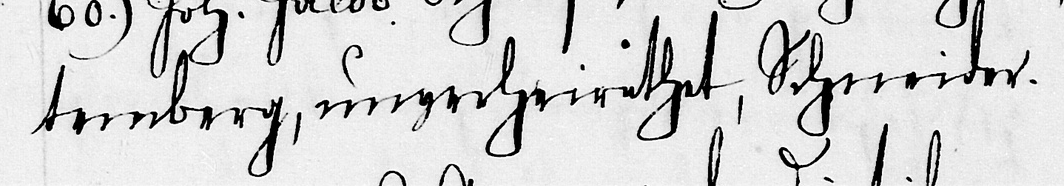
temberg, unverheirathet, Schneider.
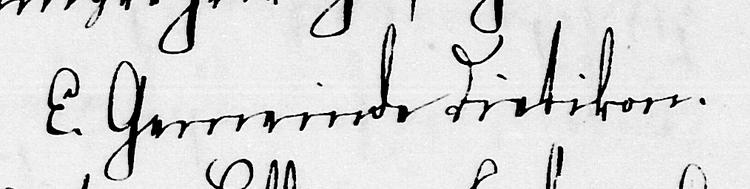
E. Gemeinde Dietikon.
